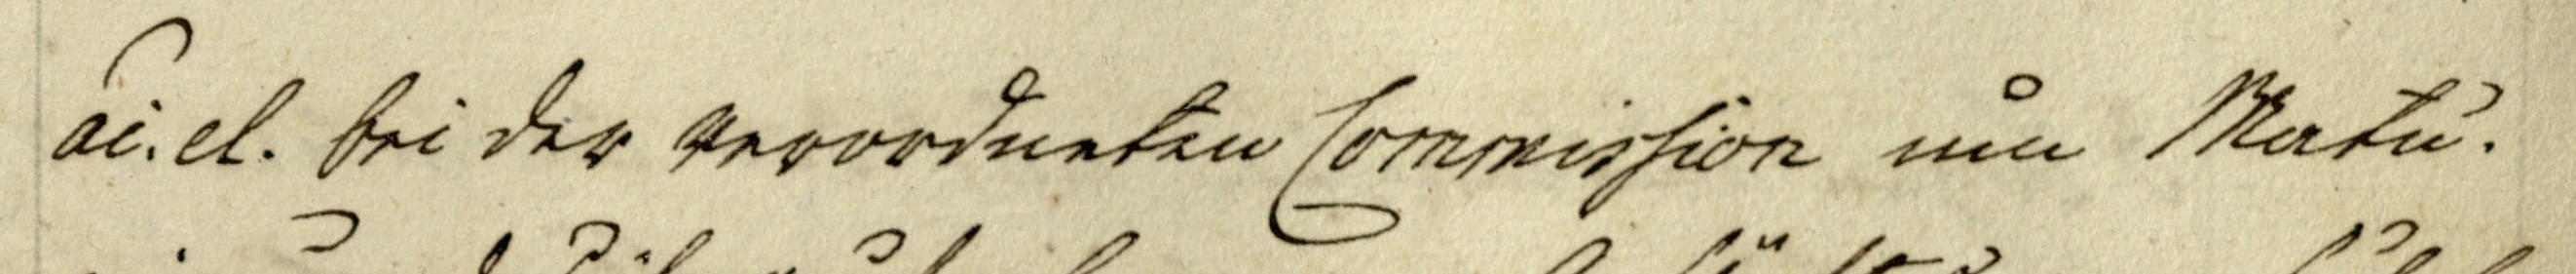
ai. el. bei der verordneten Commission um Matu¬
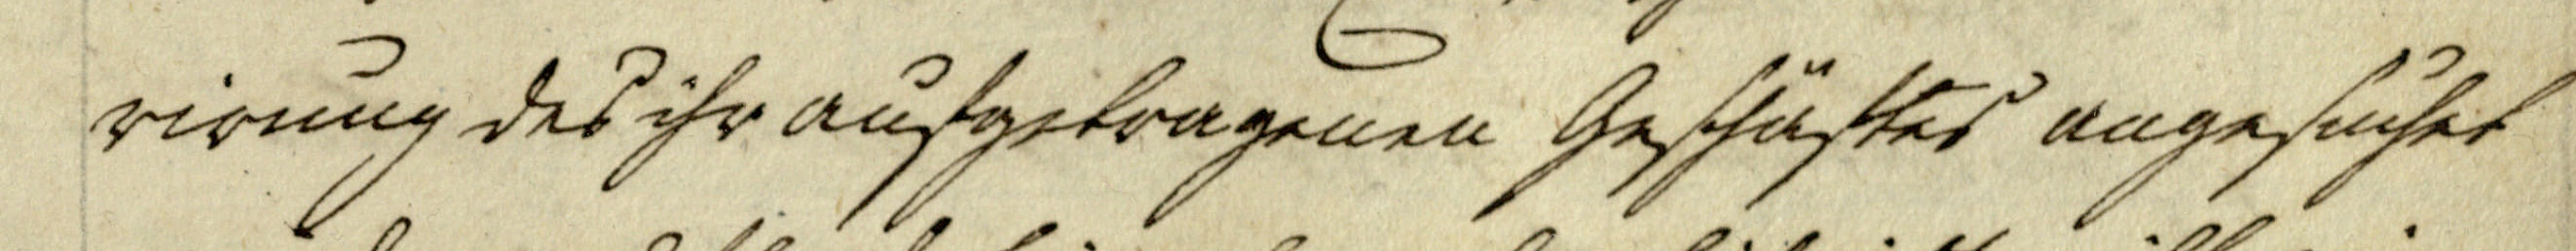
rirung des ihr aufgetragenen Geschäftes angesuchet
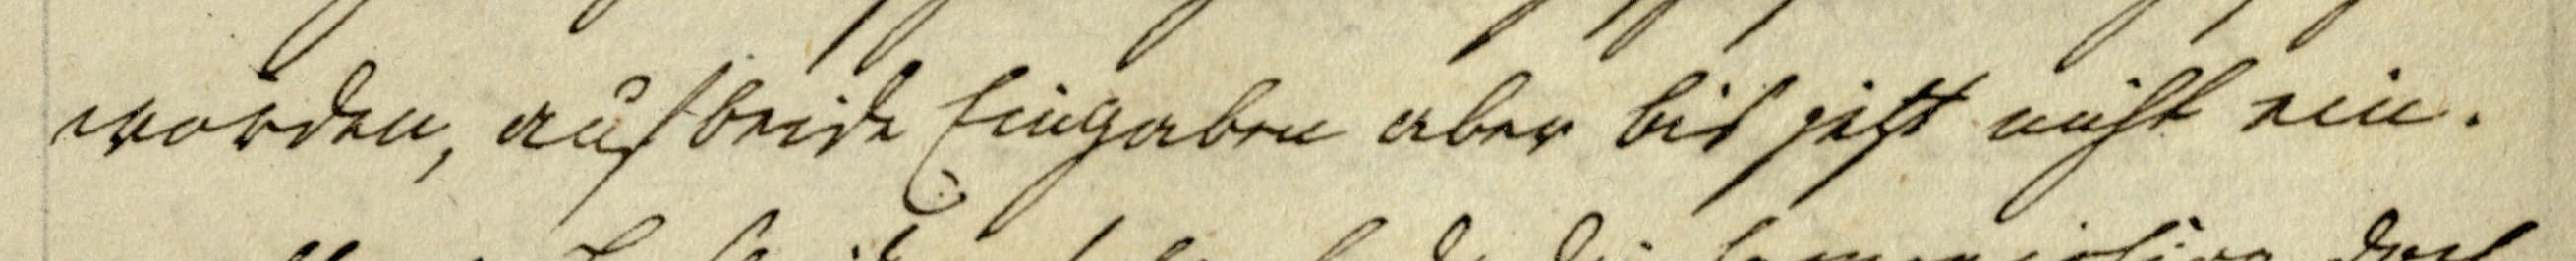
worden, auf beide Eingaben aber bis jetzt nicht ein¬
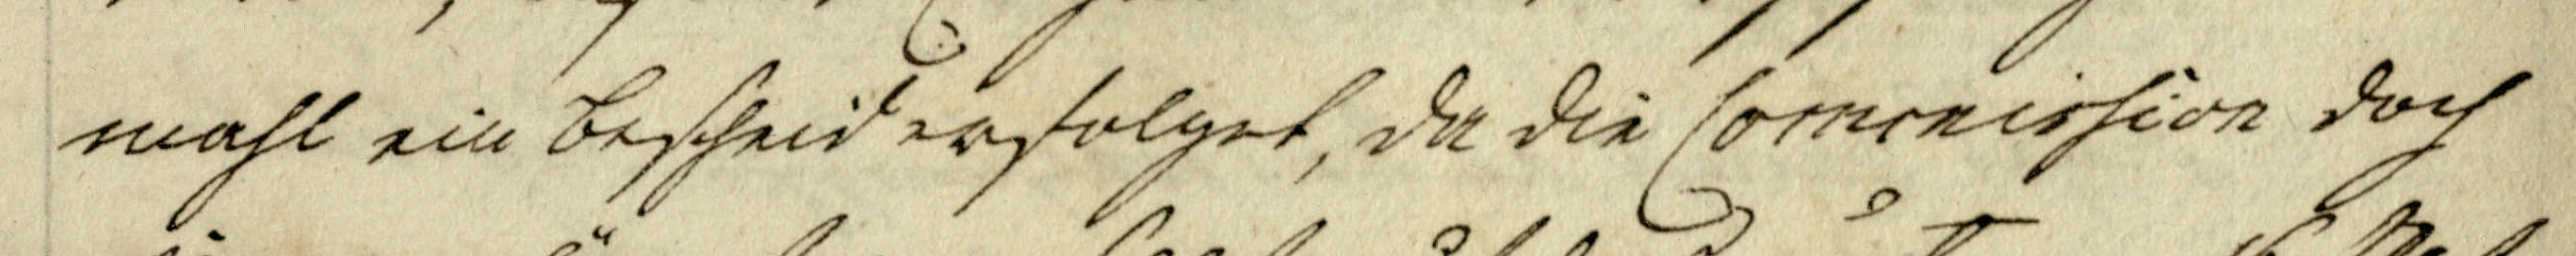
mahl ein Bescheid erfolget, da die Commission doch
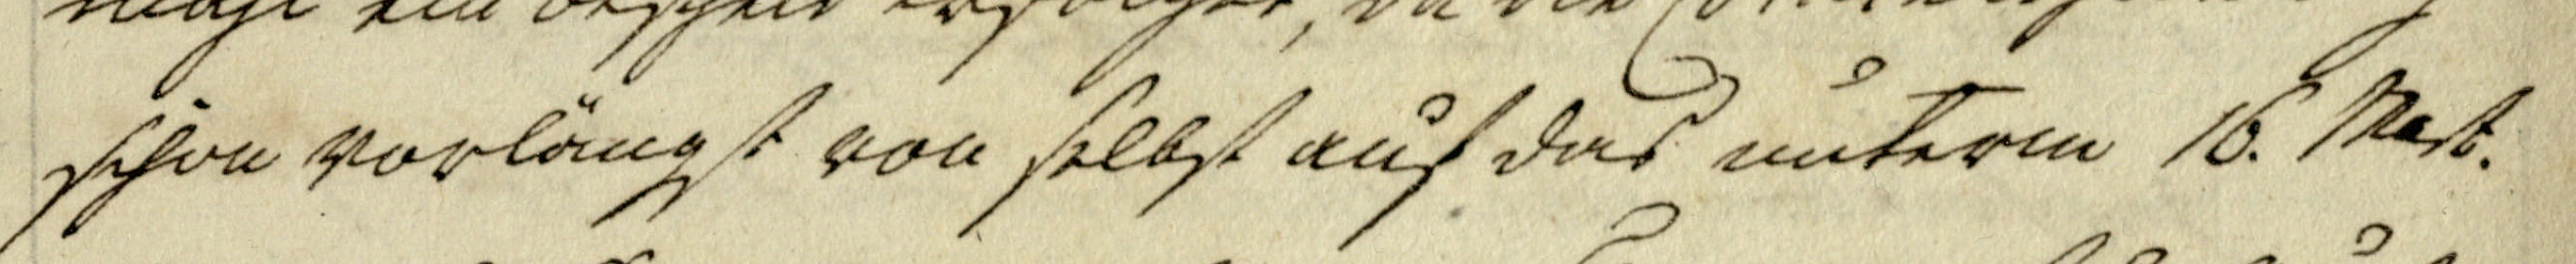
schon vorlängst von selbst auf das unterm 16. Mart.
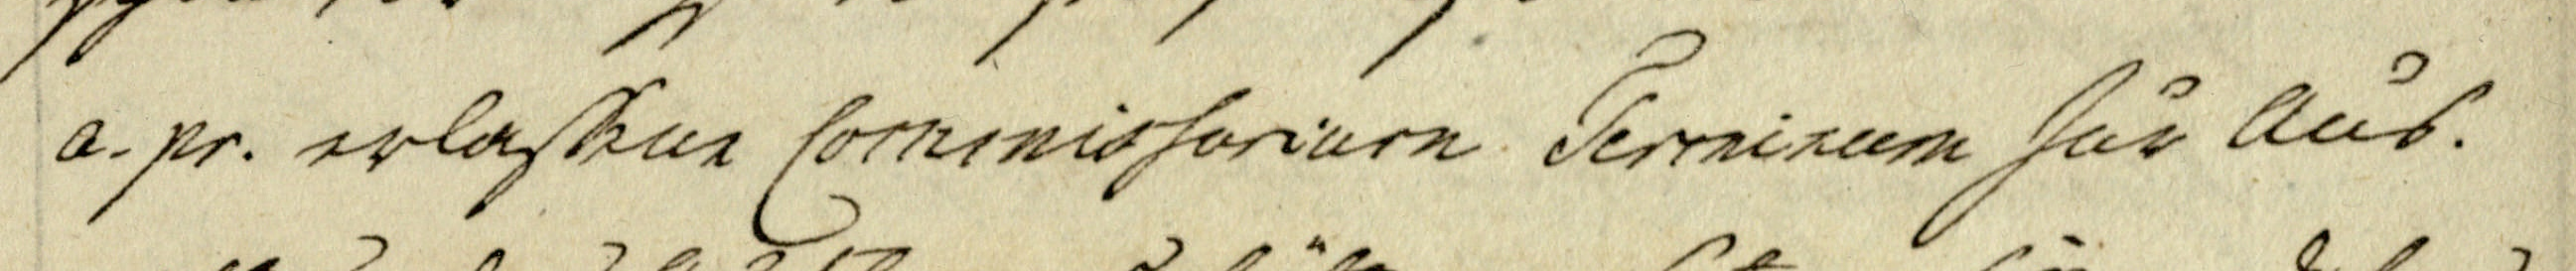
a. pr. erlassene Commissorium Terminum zur Aus¬
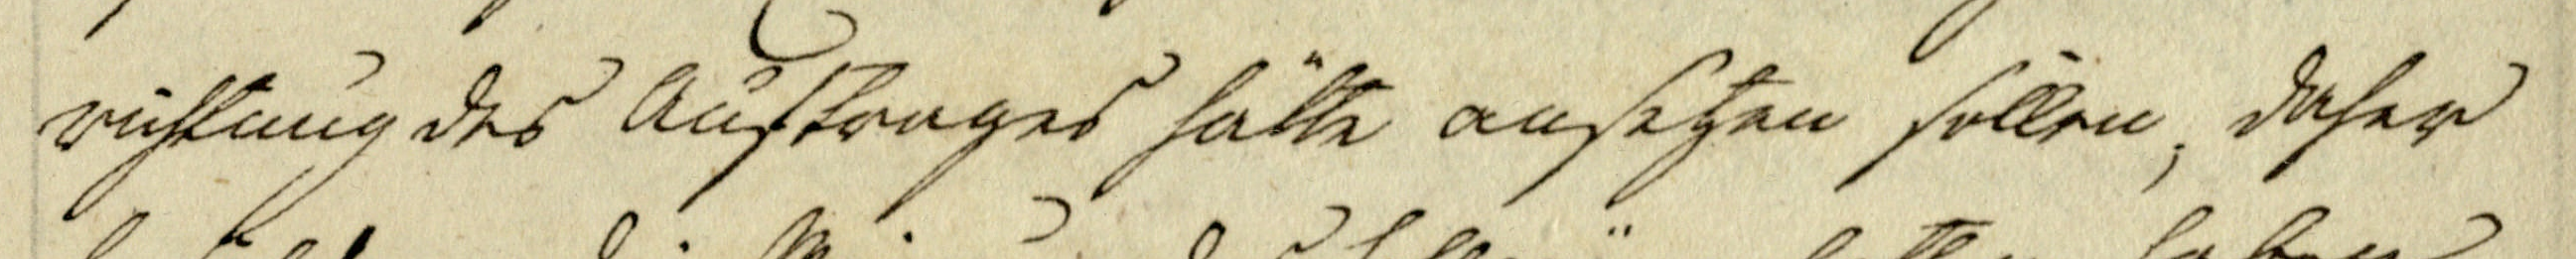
richtug des Auftrages hätte ansetzen sollen, daher
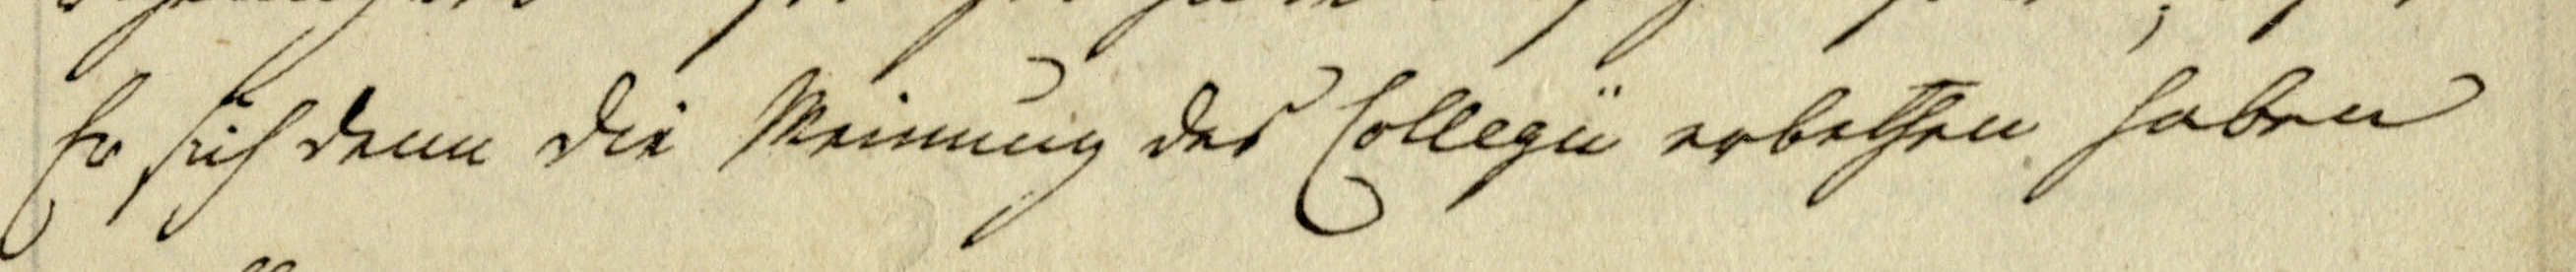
Er sich denn die Meinung des Collegii erbethen haben
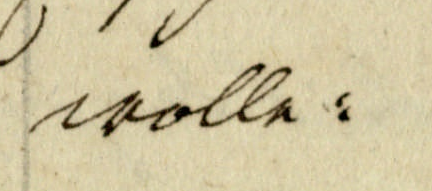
wolle:
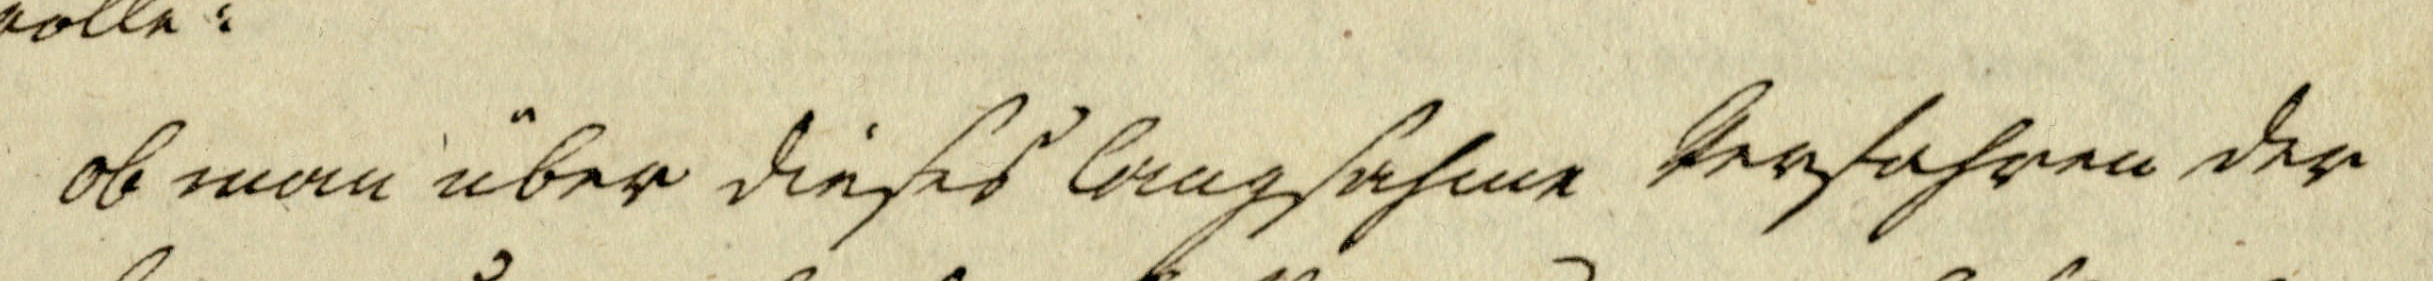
ob man über dieses langsahme Verfahren der
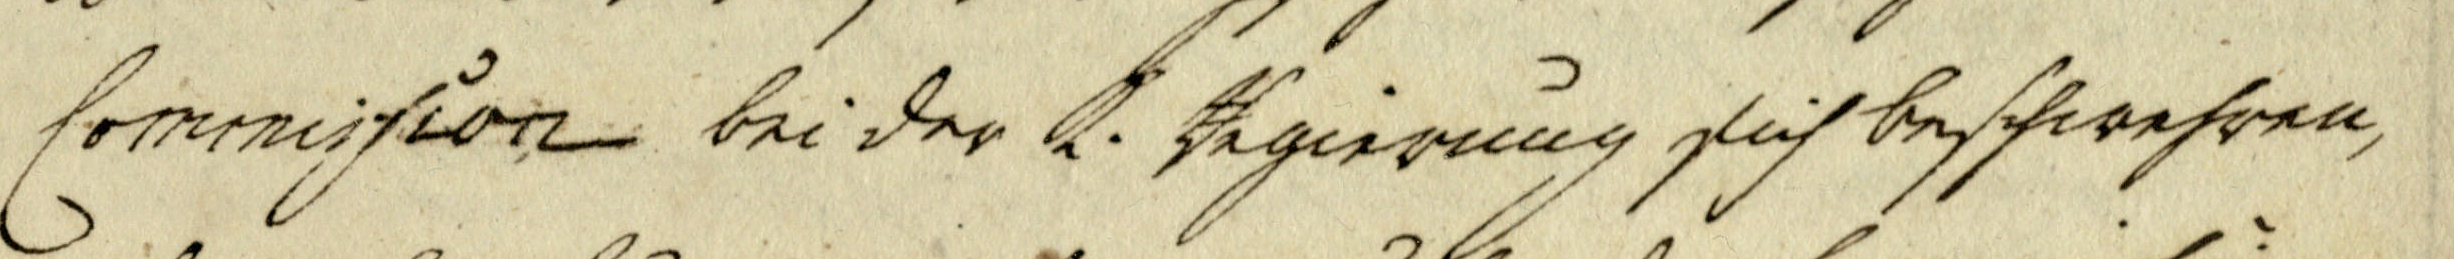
Commission bei der K. Regierung sich beschwehren,
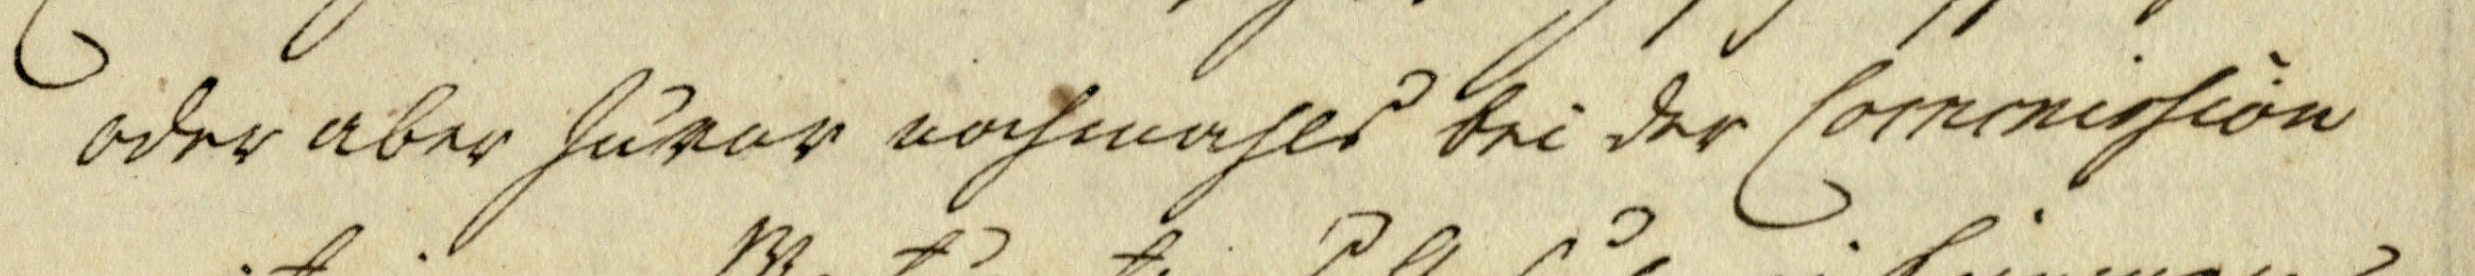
oder aber zuvor nochmahls bei der Commission
